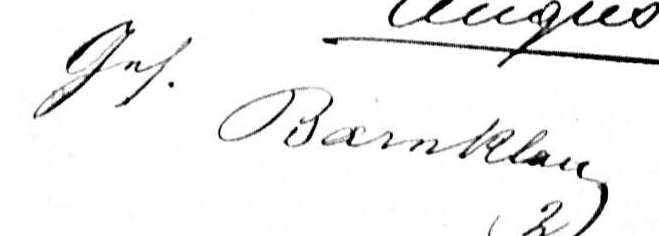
Ges. Barnklau
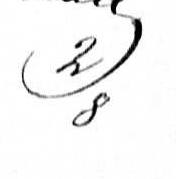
2/8
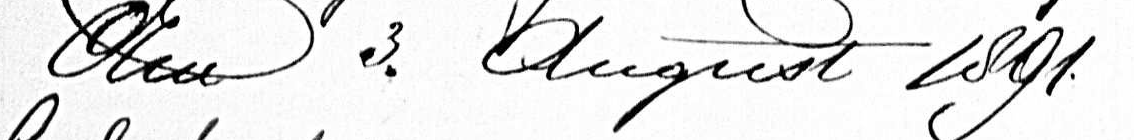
Am 3. August 1891
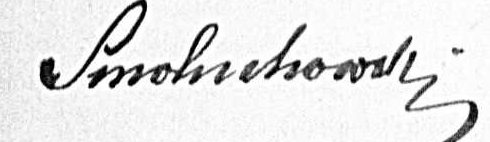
Smolnchowski
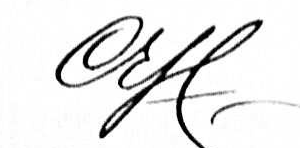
Ah. E.
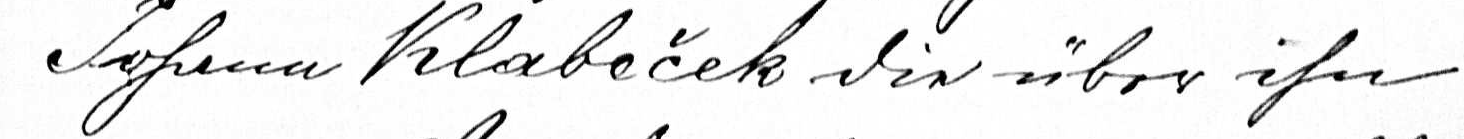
Johann Klabeček die über ihn
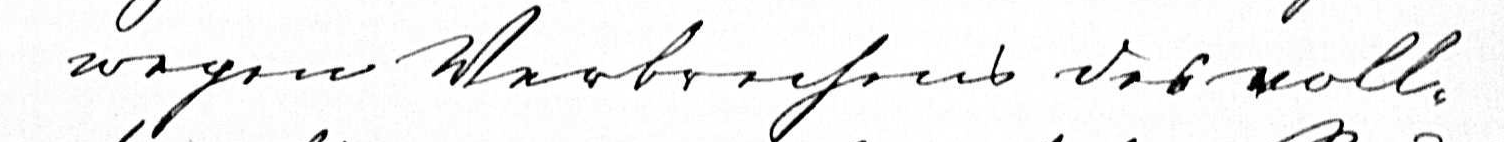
wegen Verbrechens des voll¬
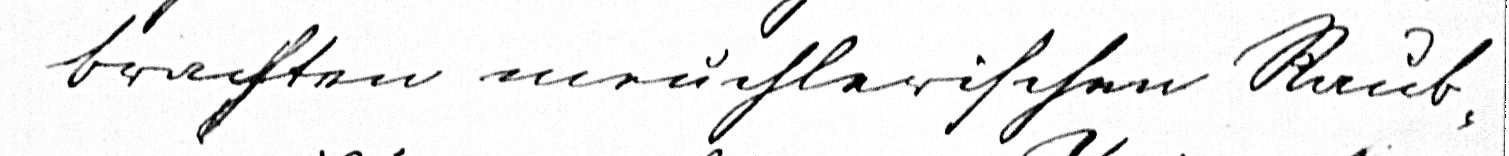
brachten meuchlerischen Raub¬
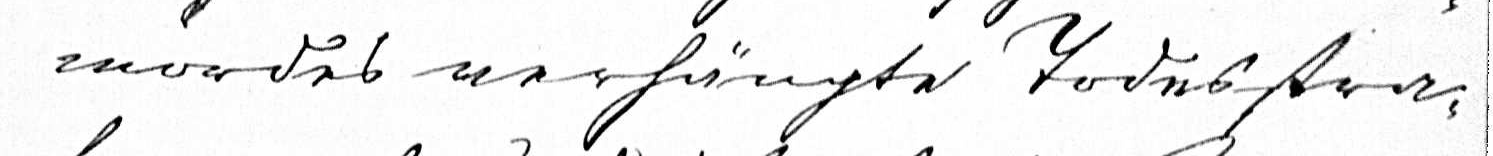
mordes verhängte Todesstra¬
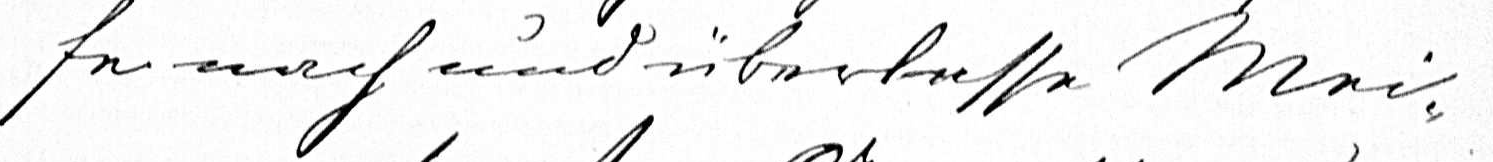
fe nach und überlasse Mei¬
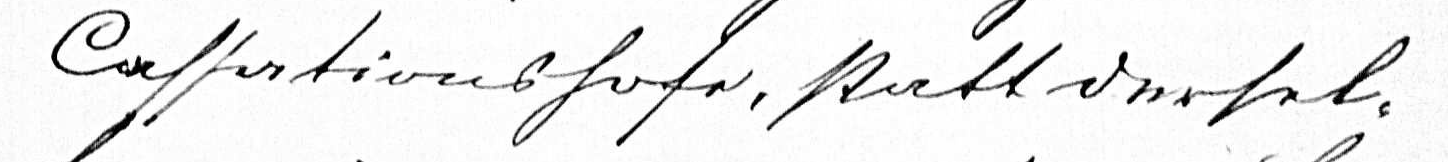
Cassationshofe, statt dersel¬
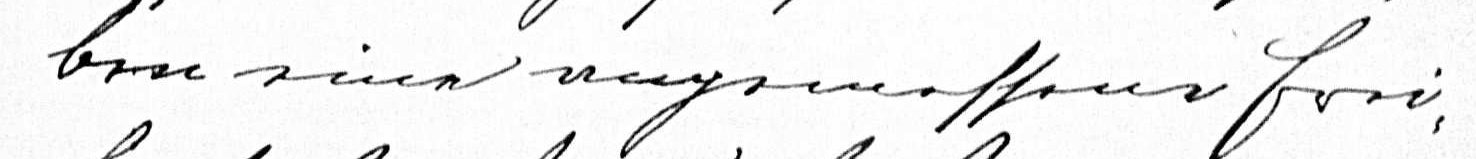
ben eine angemessene Frei¬
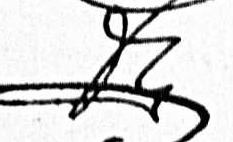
FJ
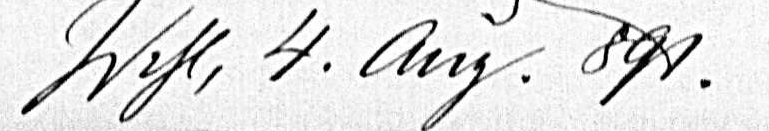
Ischl 4. August 1891
